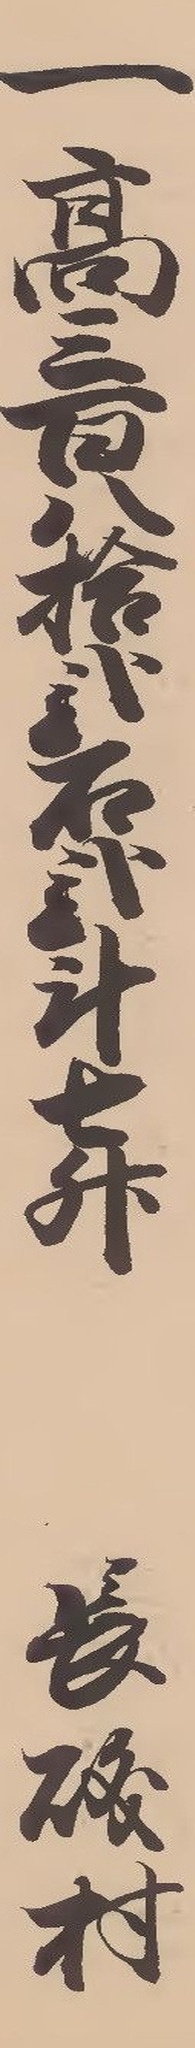一高三百八拾弐石弐斗七升長磯村
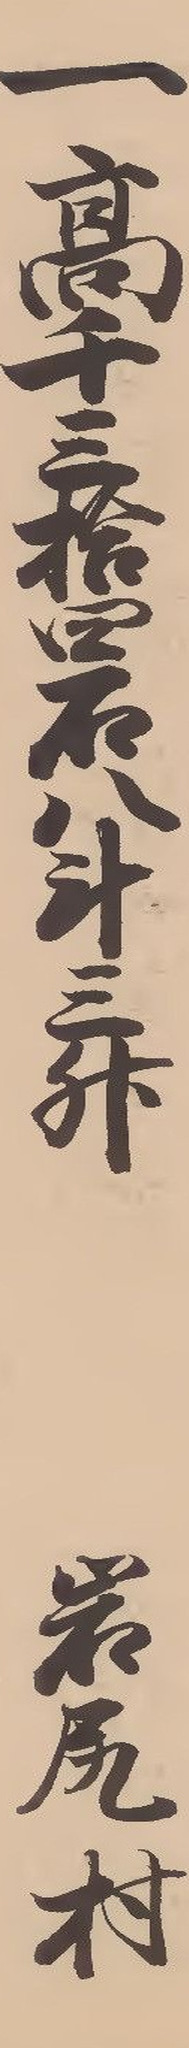一高千三拾四石八斗三升岩尻村
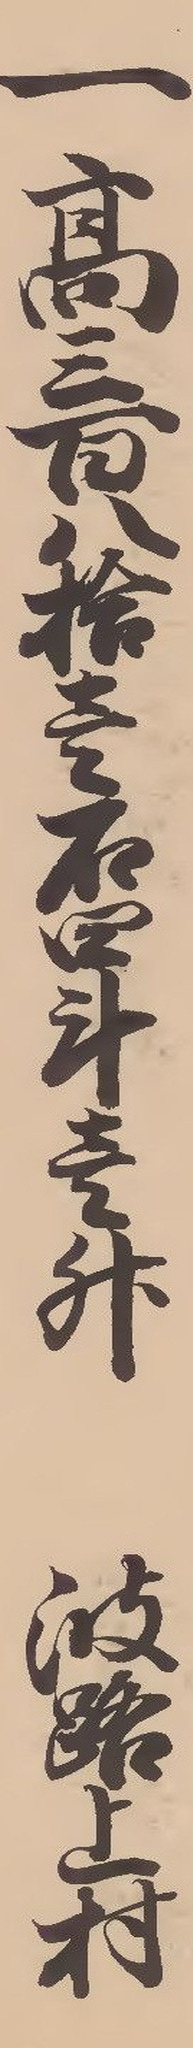一高三百八拾壱石四斗壱升波路上村
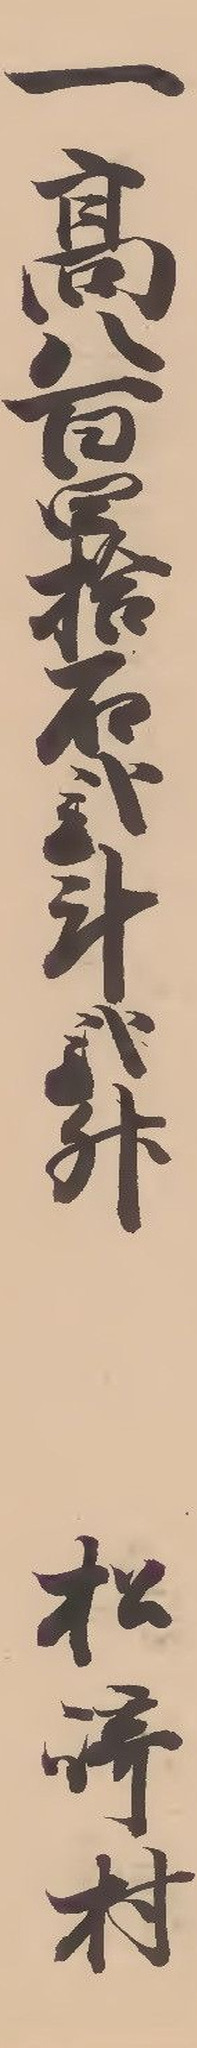一高八百四拾石弐斗弐升松崎村

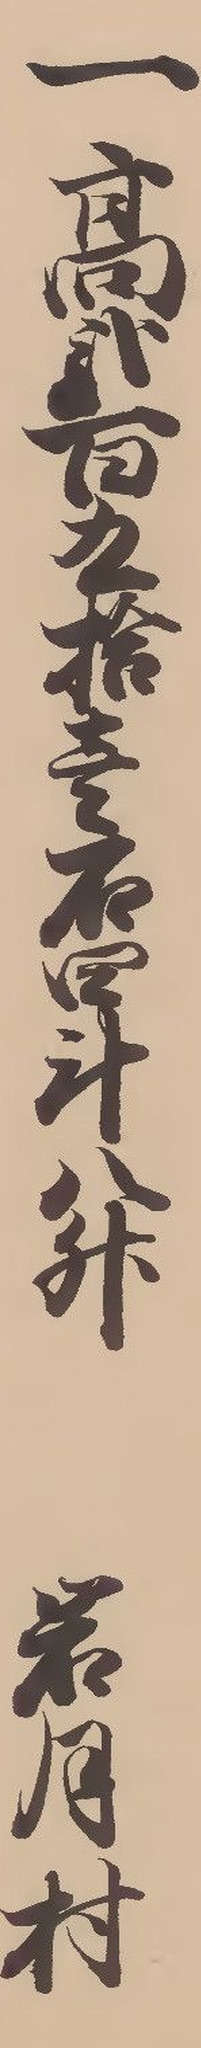一高弐百九拾壱石四斗八升岩月村
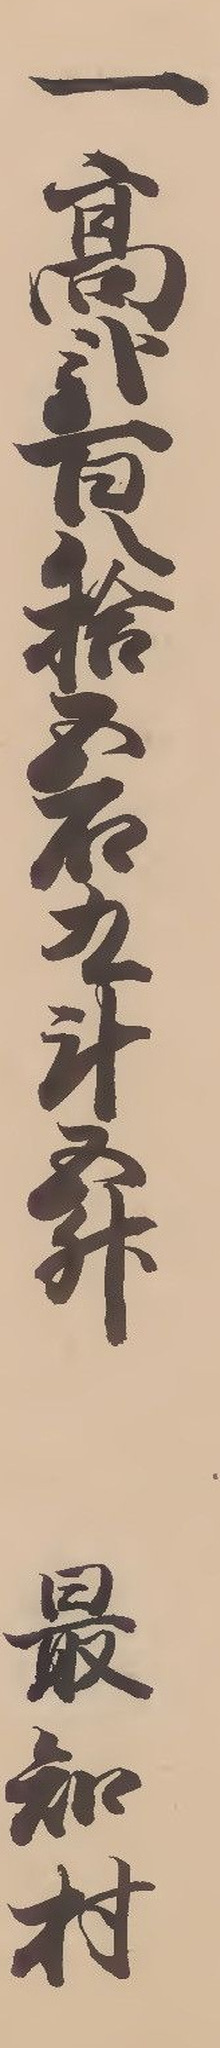一高弐百八拾五石九斗五升最知村
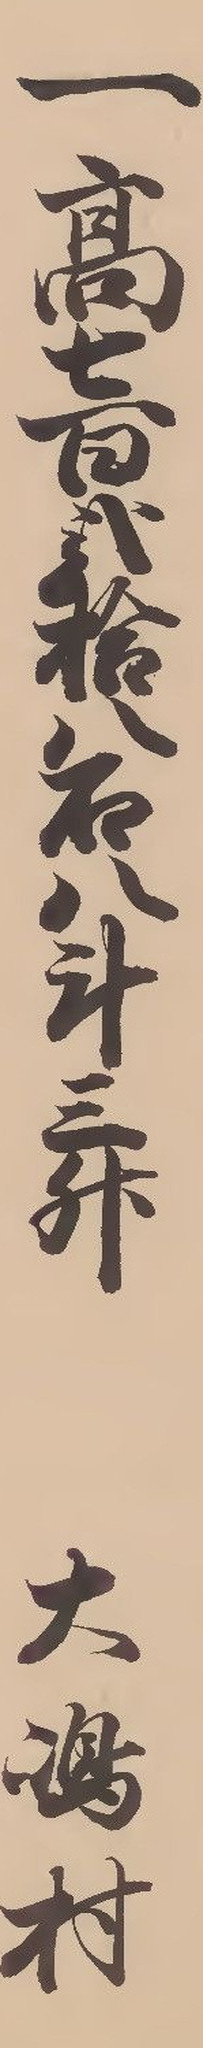一高七百弐拾八石八斗三升大島村
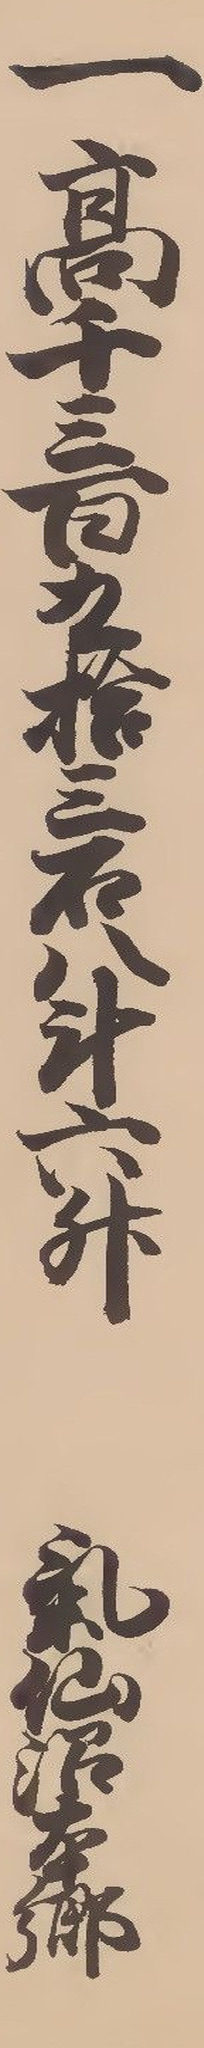一高千三百九拾三石八斗六升気仙沼本郷
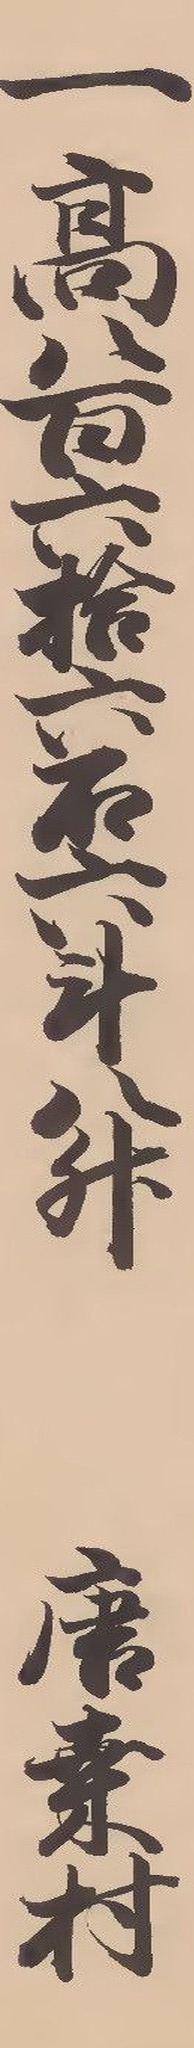一高八百六拾六石六斗八升唐桑村
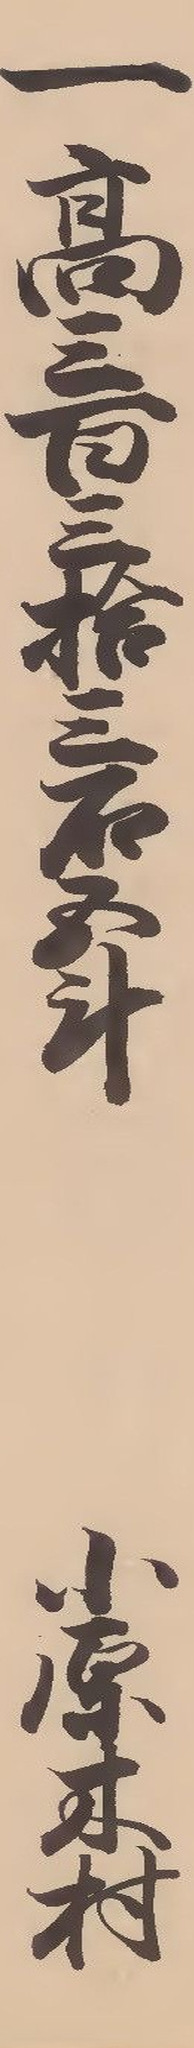一高三百三拾三石五斗小原木村
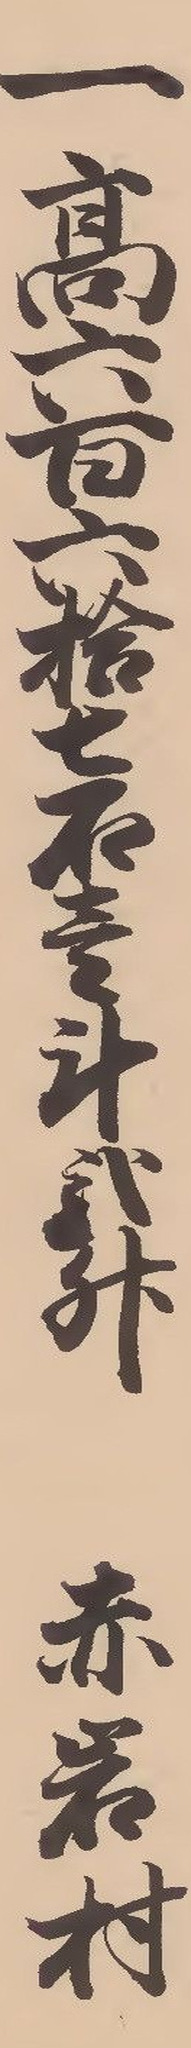一高六百六拾七石壱斗弐升赤若村
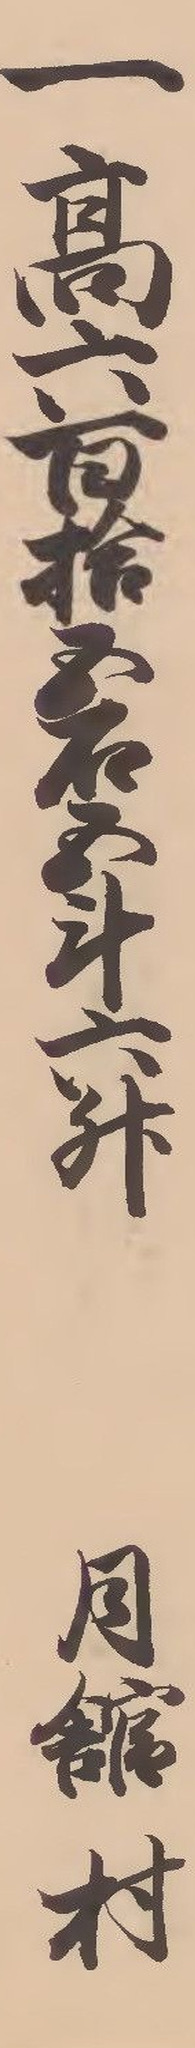一高六百拾五石五斗六升月舘村

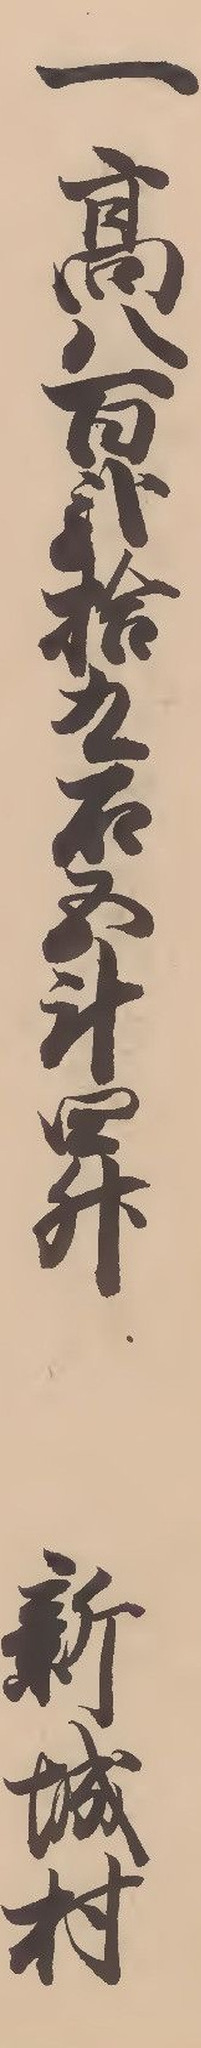一高八百弐拾九石五斗四升新城村
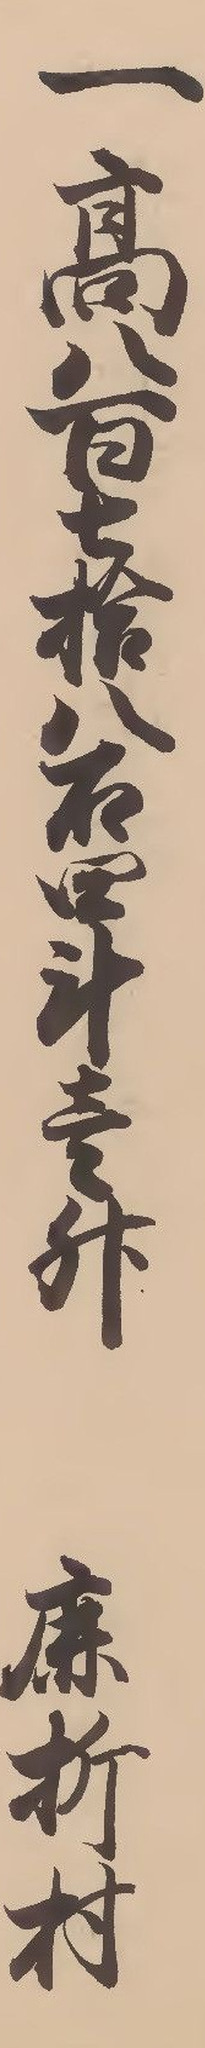一高八百七拾八石四斗壱升鹿折村
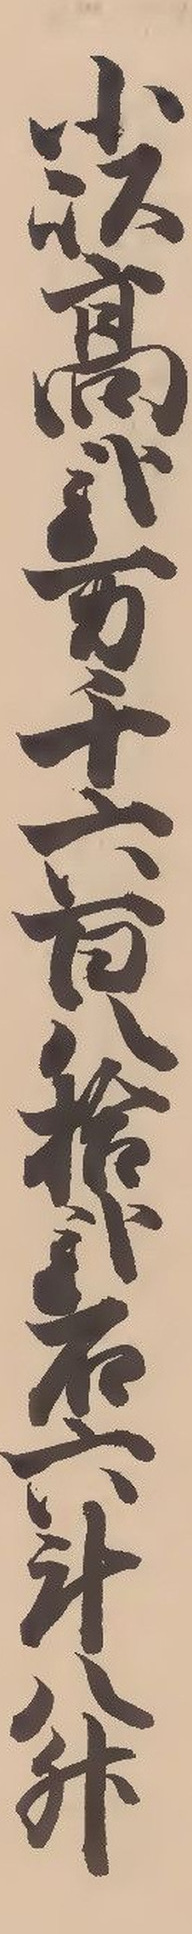小以高弐万千六百八拾弐石六斗八升
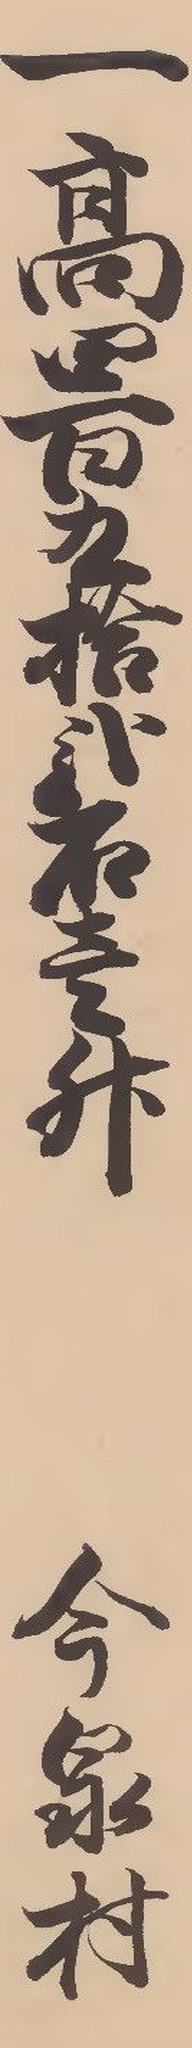一高四百九拾弐石壱升今泉村
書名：陸奥国郷帳　５
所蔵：国立公文書館 National Archives of Japan
